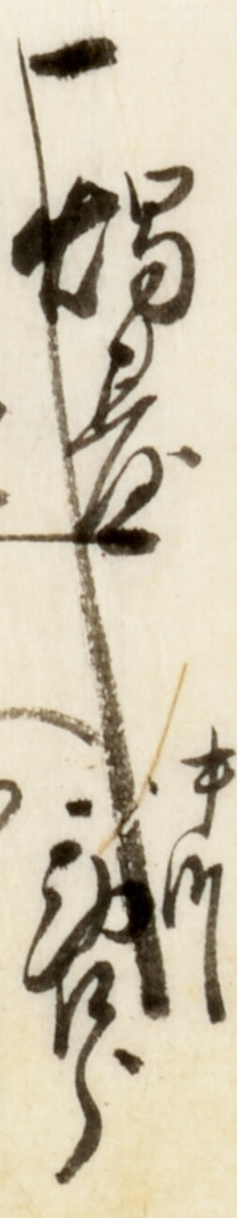一燭台中町
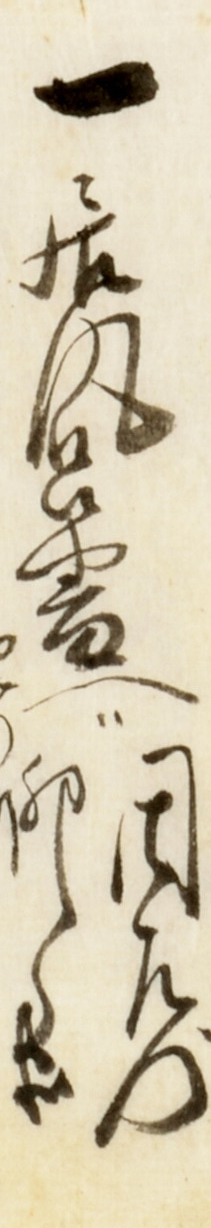一居風呂番岡左衛門
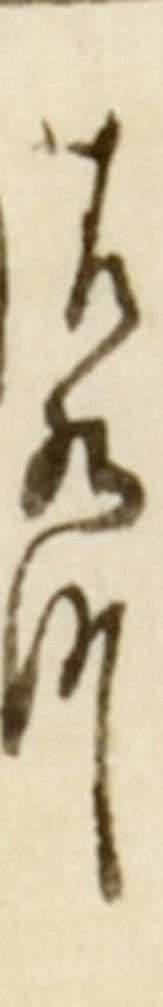清水町
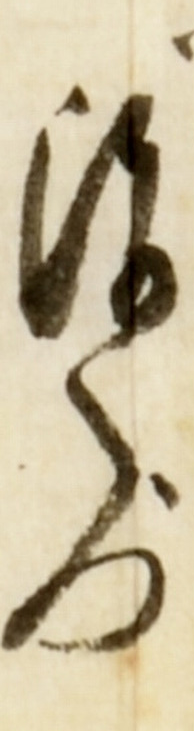孫右衛門
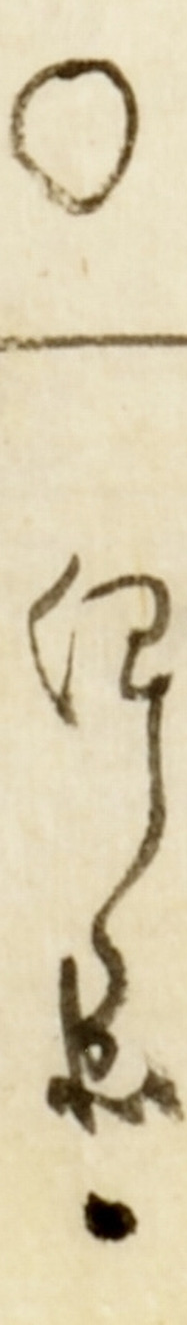○佐兵衛
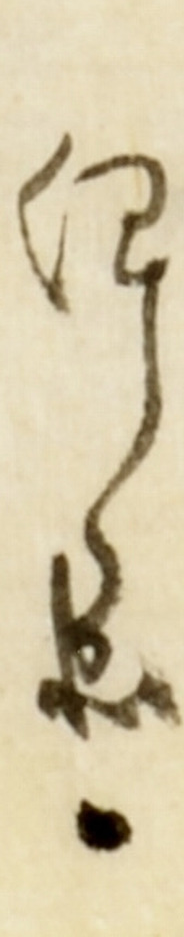卯兵衛

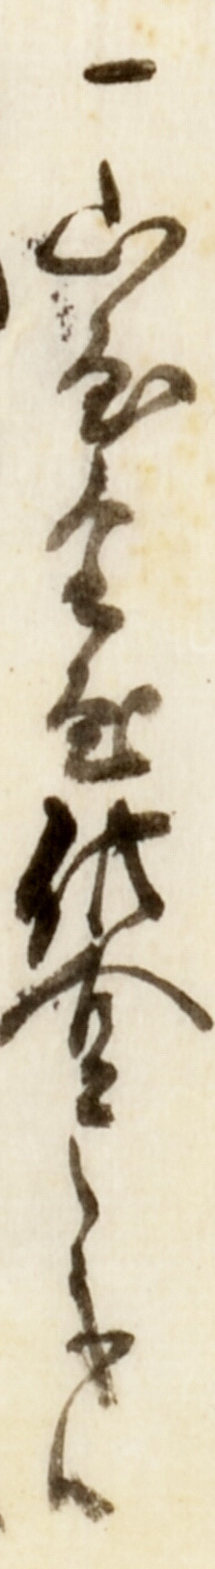一山屋金屋代金之儀ハ
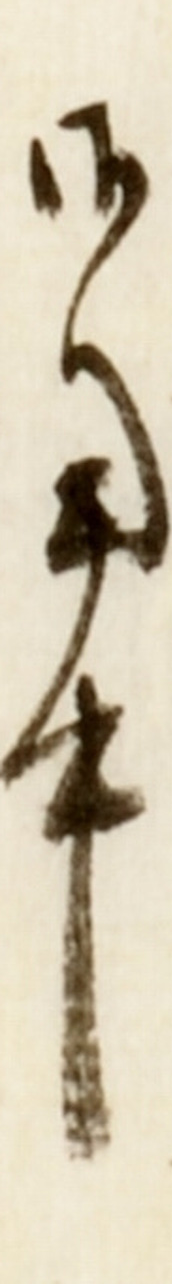御用中
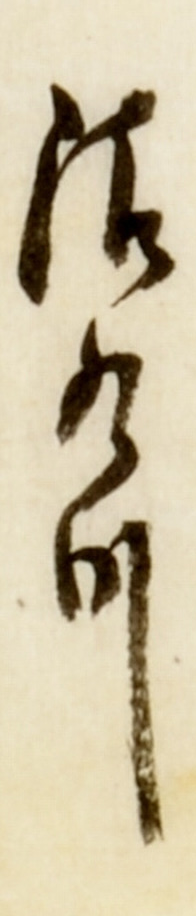清水町
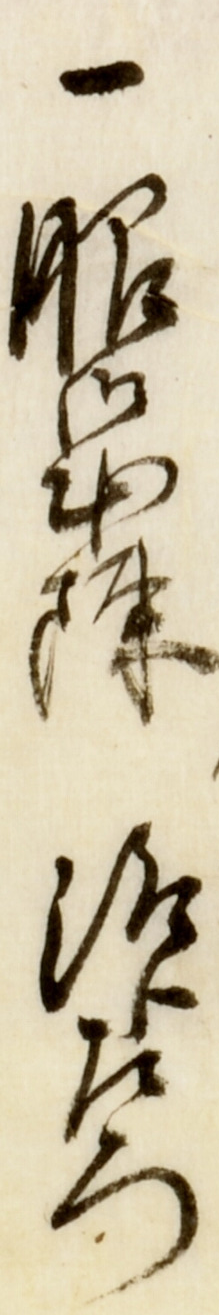一脇御本陣郎左衛門
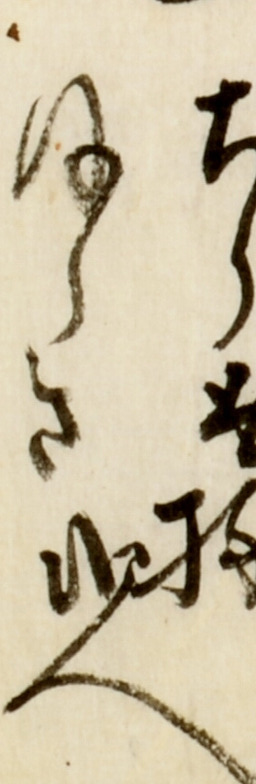ほうき弐人
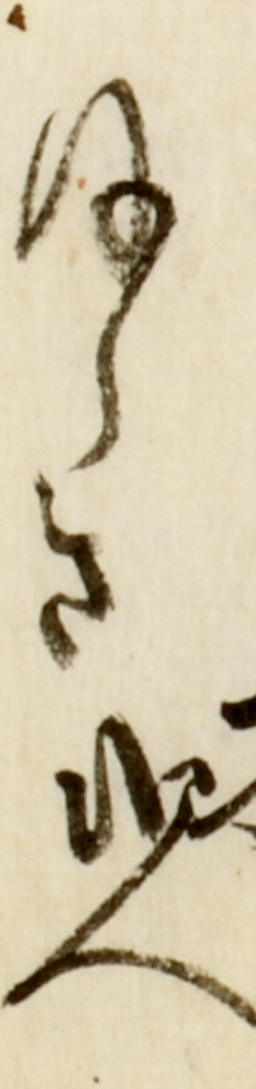ほうき弐人

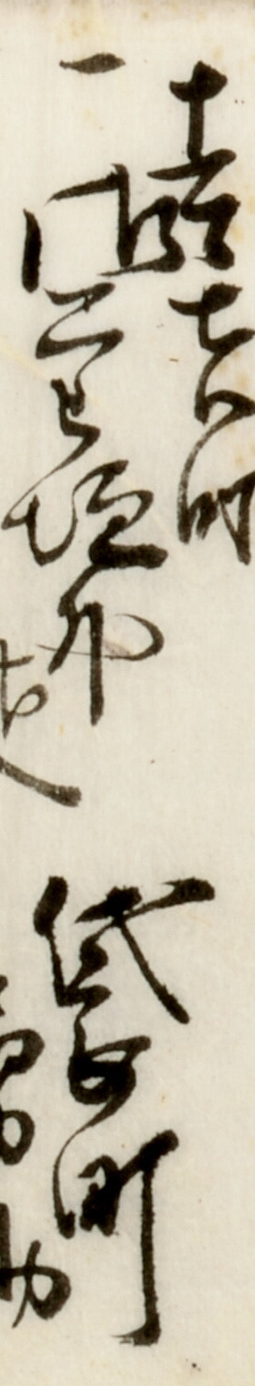一御堂垣外袋町
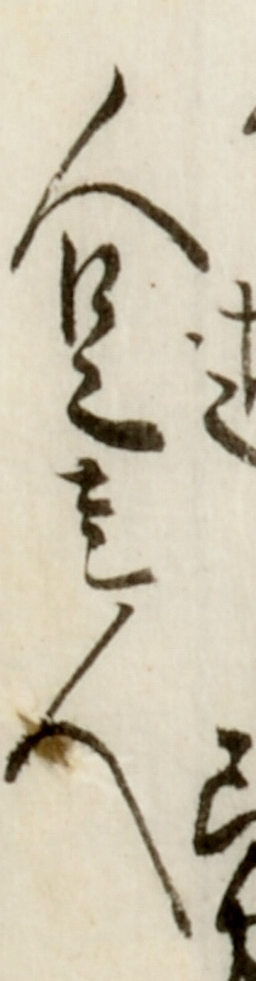人足壱人
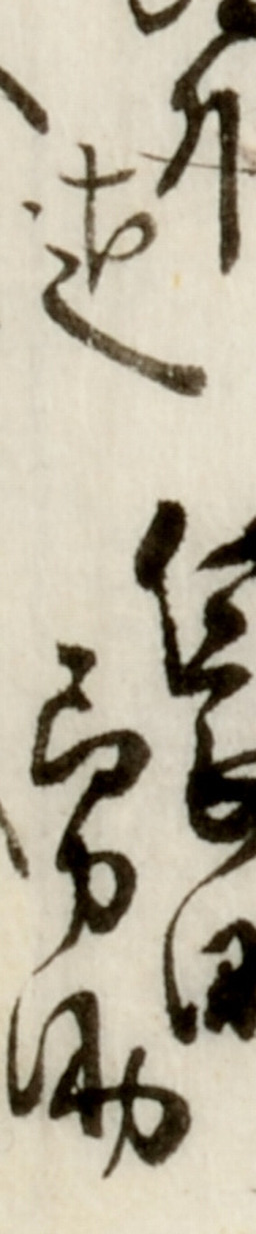迄勇助
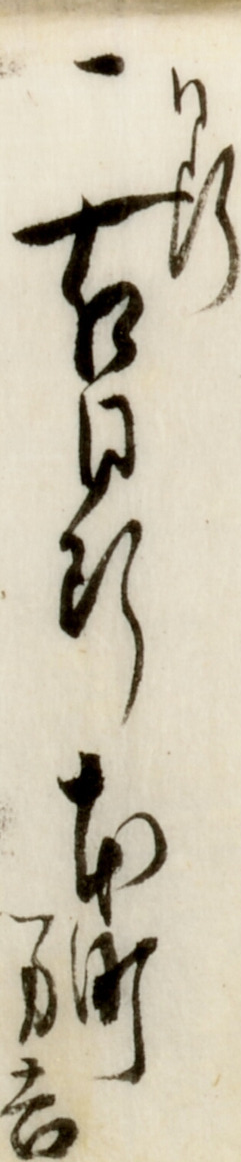一右同断本町
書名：役配人足割合帳
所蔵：伊那市立高遠町図書館・合同会社AMANE
